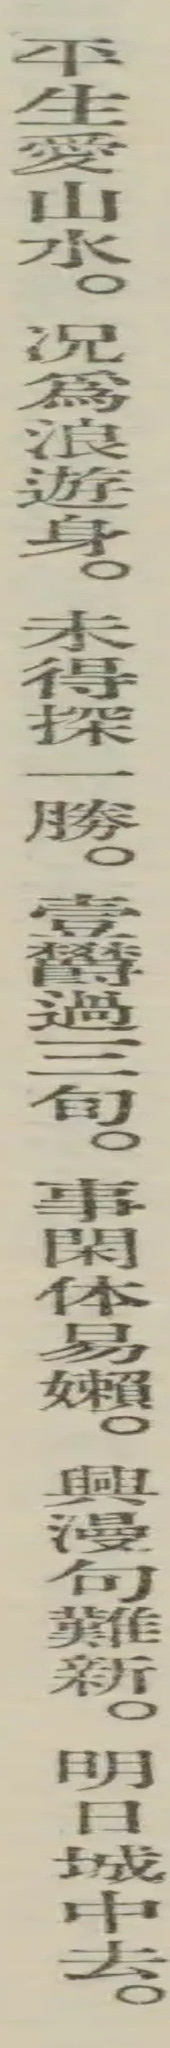平生愛山水。况爲浪遊身。未得探一勝。壹欝過三旬。事閑体易嬾。興漫句難新。明日城中去。
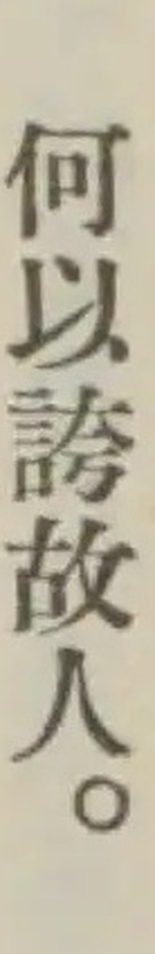何以誇故人。
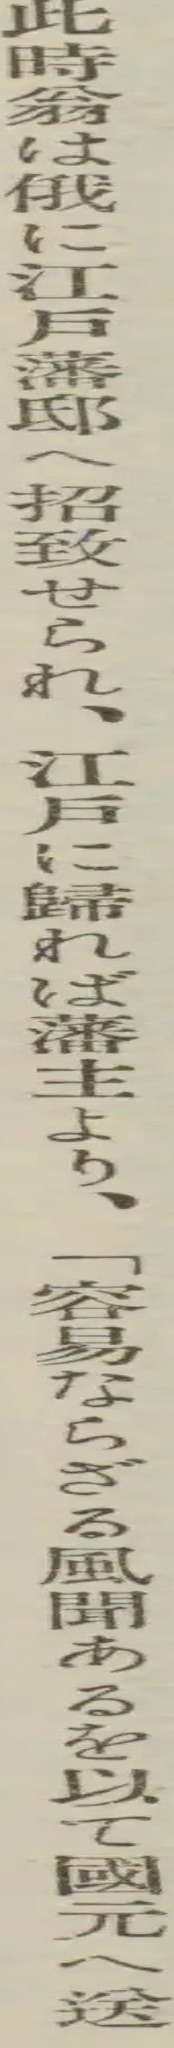此時翁は俄に江戸藩邸へ招致せられ、江戸に帰れば藩主より、「容易ならざる風聞あるを以て国元へ送
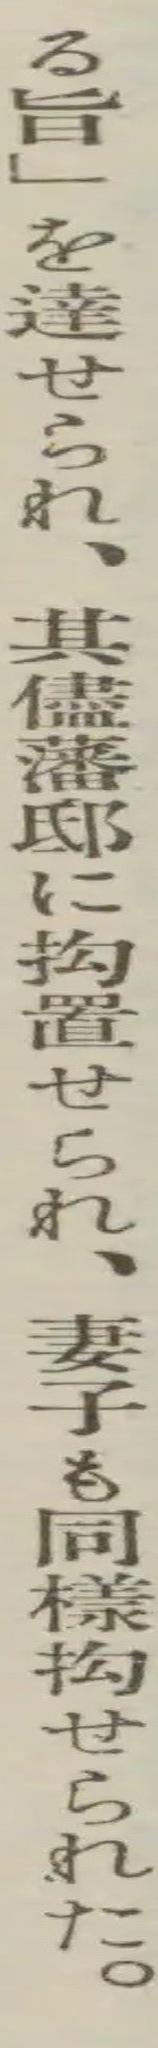る旨」を達せられ、其侭藩邸に拘置せられ、妻子も同様拘せられた。
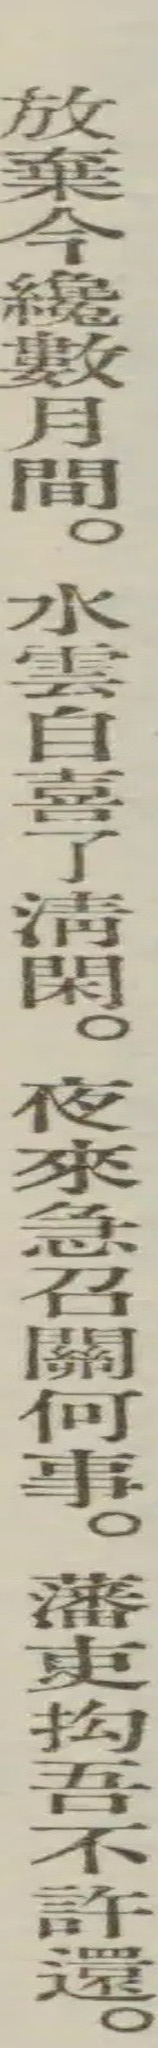放棄今纔数月間。水雲自喜了清閑。夜来急召關何事。藩吏抅吾不許還。
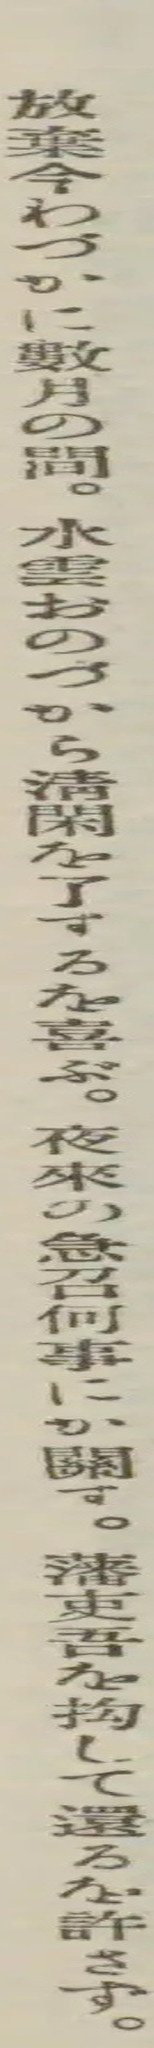放棄今わづかに数月の間。水雲おのづから清閑を了するを喜ぶ。夜来の急召何事にか関す。藩吏吾を拘して還るを許さず。
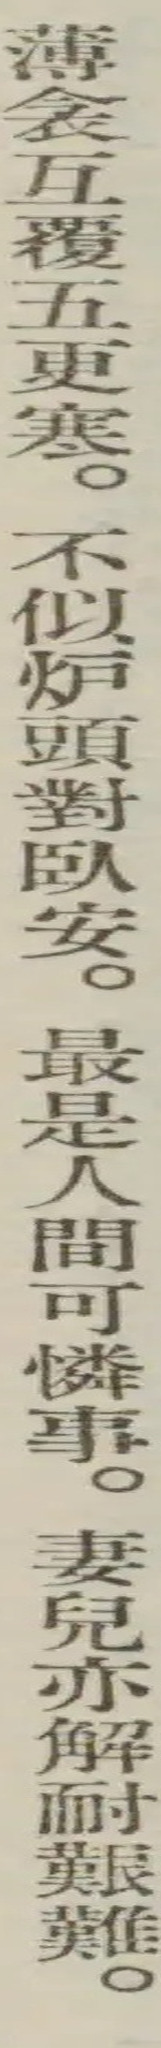薄衾互覆五更寒。不似炉頭對臥安。最是人間可憐事。妻兒亦解耐艱難。
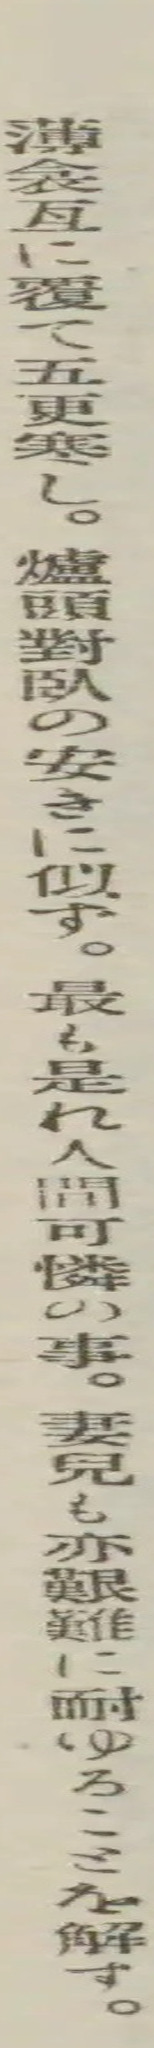薄衾互に覆て五更寒し。爐頭対臥の安きに似ず。最も是れ人間可憐の事。妻兒も亦艱難に耐ゆることを解す。
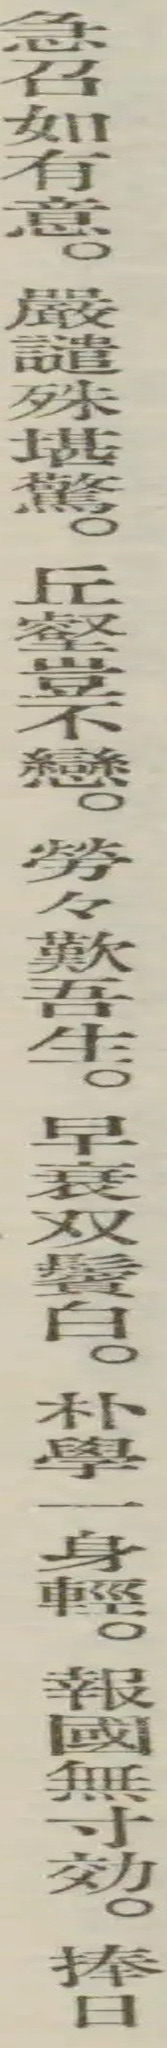急召如有意。嚴譴殊堪驚。丘壑豈不戀。勞々歎吾生。早衰双鬢白。朴學一身輕。報國無寸効。捧日
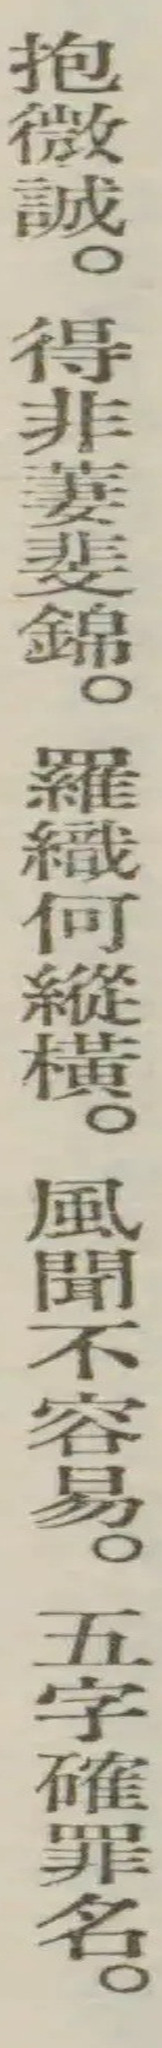抱微誠。得非萋斐錦。羅織何縦横。風聞不容易。五字確罪名。
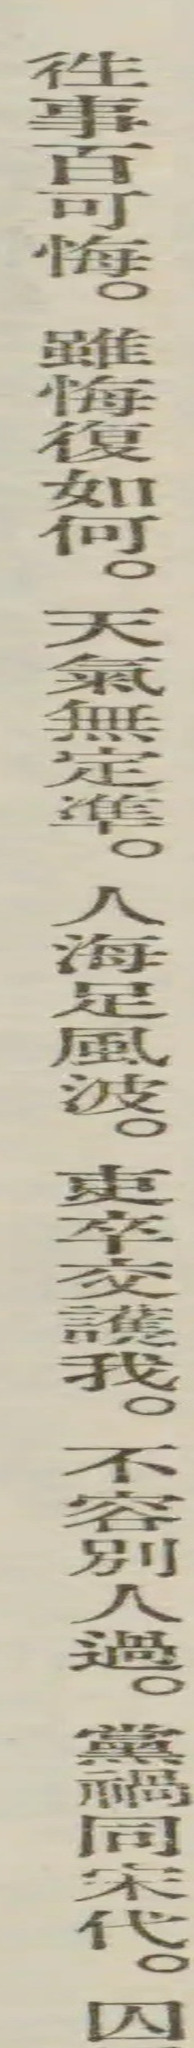往事百可悔。雖悔復如何。天氣無定凖。人海足風波。吏卒交護我。不容別人過。黨禍同宋代。囚係
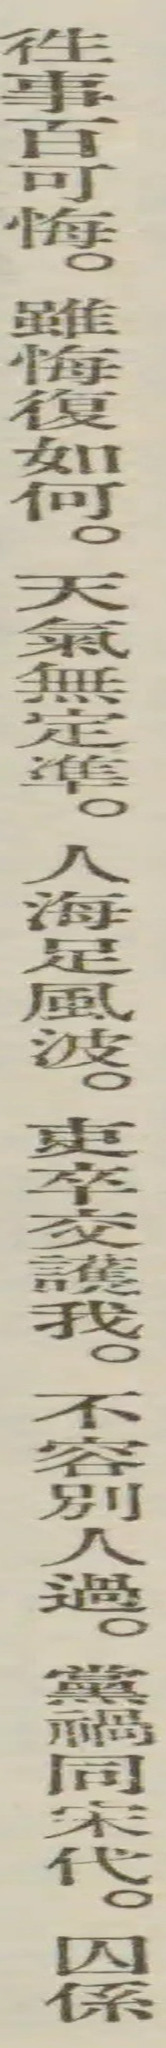往事百可悔。雖悔復如何。天氣無定凖。人海足風波。吏卒交護我。不容別人過。黨禍同宋代。囚係
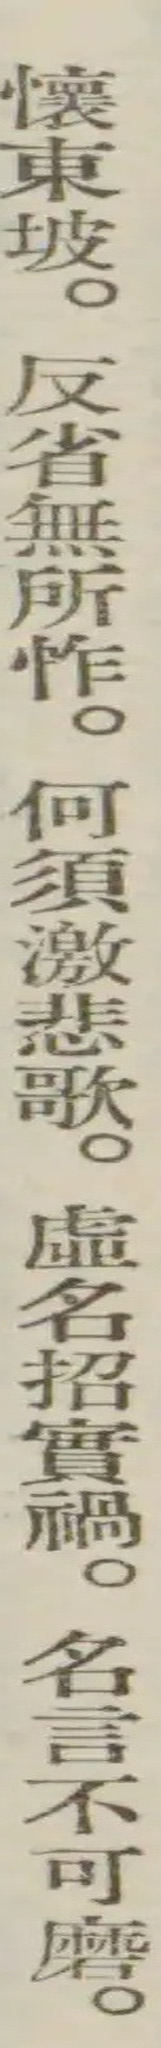懐東坡。反省無所作。何須激悲歌。虚名招實禍。名言不可磨。
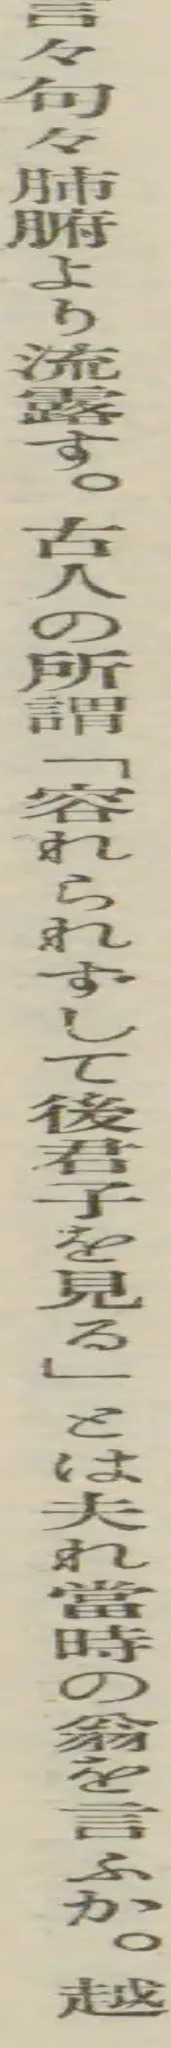言々句々肺腑より流露す。古人の所謂「容れられずして後君子を見る」とは夫れ当時の翁を言ふか。越

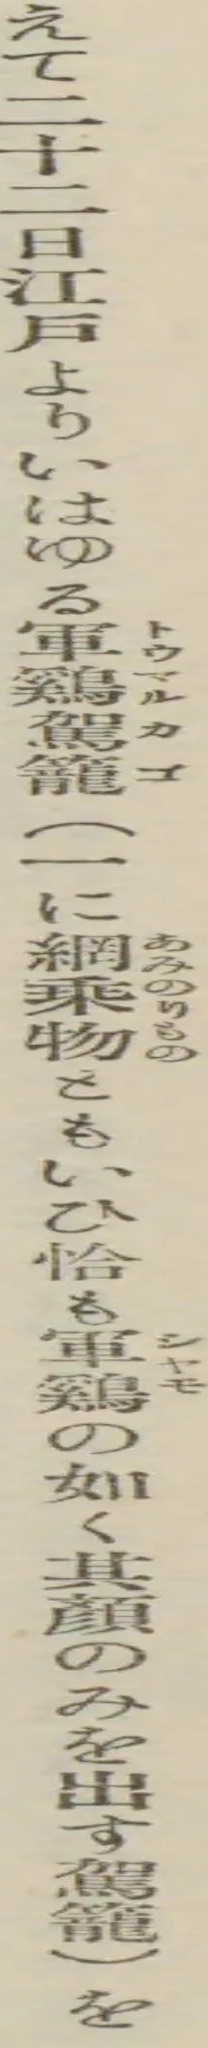えて二十二日江戸よりいはゆる軍鶏駕籠(一に網乗物ともいひ恰も軍鶏の如く其顔のみを出す駕籠)を
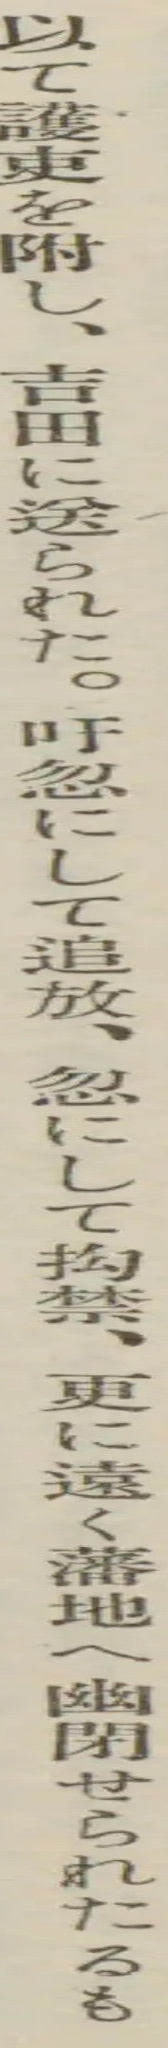以て護吏を附し、吉田に送られた。吁忽にして追放、忽にして拘禁、更に遠く藩地へ幽閉せたれたるも
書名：小野湖山翁小伝
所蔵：国立国会図書館 National Diet Library, JAPAN
